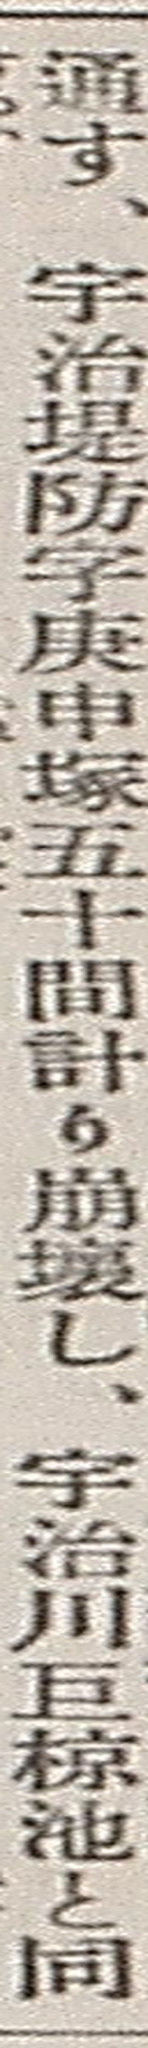通す、宇治堤防字庚甲塚五十間計り崩壊し、宇治川巨椋池と同
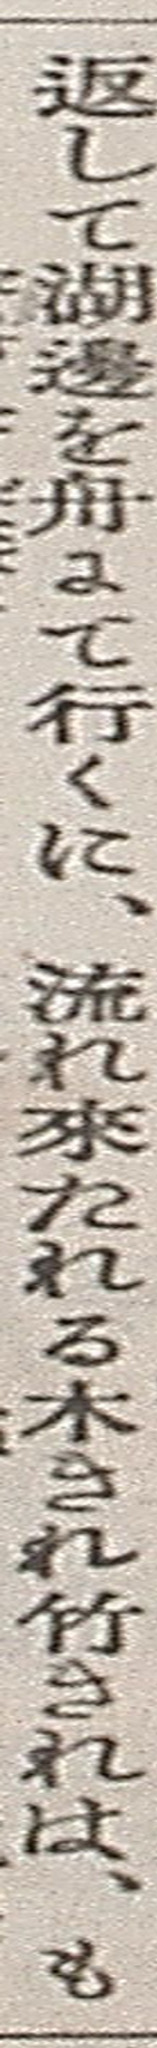返して湖辺を舟にて行くに、流れ来たれる木きれ竹きれは、も
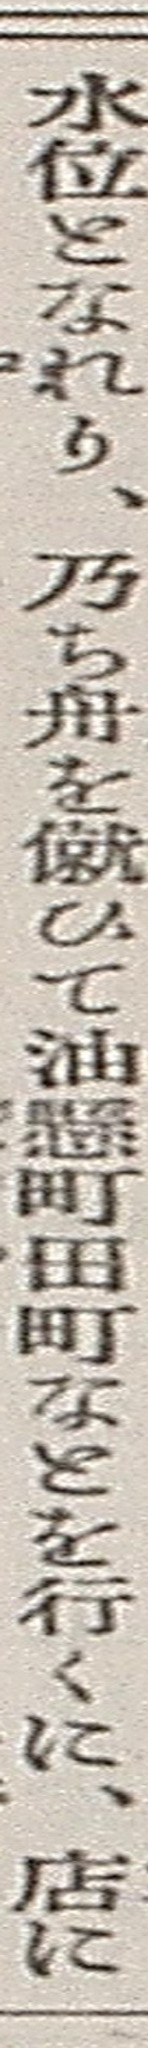水位となれり、乃ち舟を僦ひて油懸町田町なとを行くに、店に
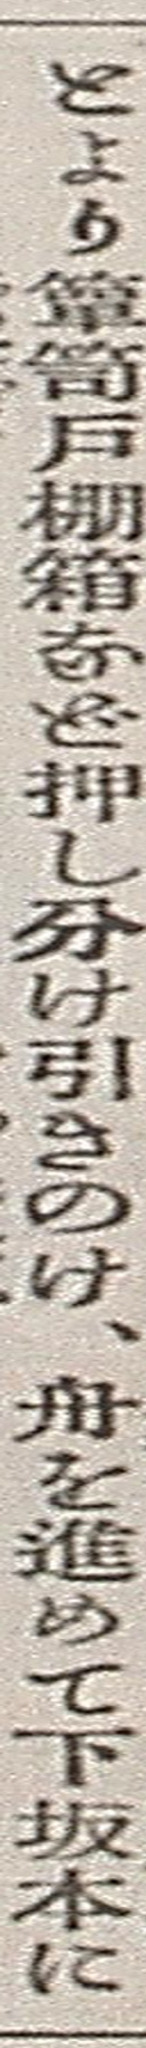とより箪笥戸棚箱など押し分け引きのけ、舟を進めて下坂本に
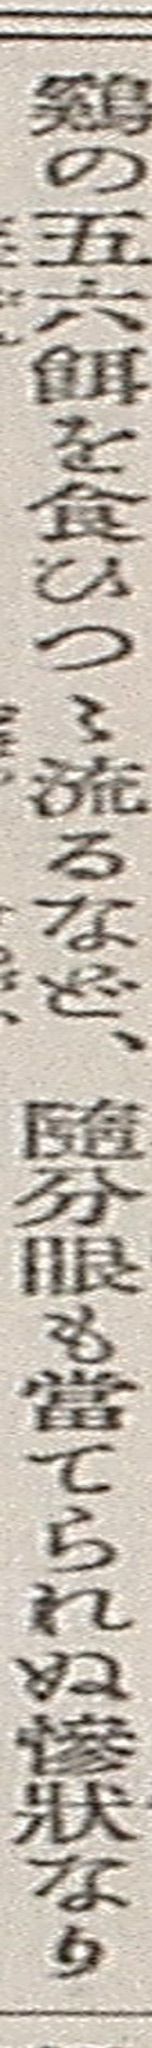鶏の五六餌を食ひつゝ流るなど、随分眼も当られぬ惨状なり
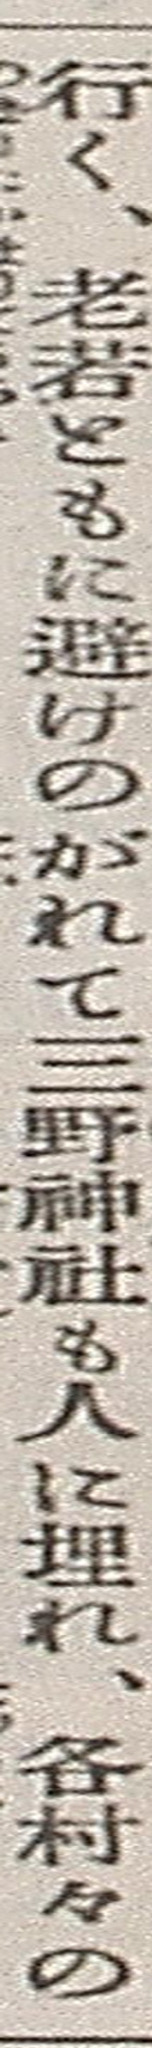行く、老若ともに避けのがれて三野神社も人に埋れ、各村々の
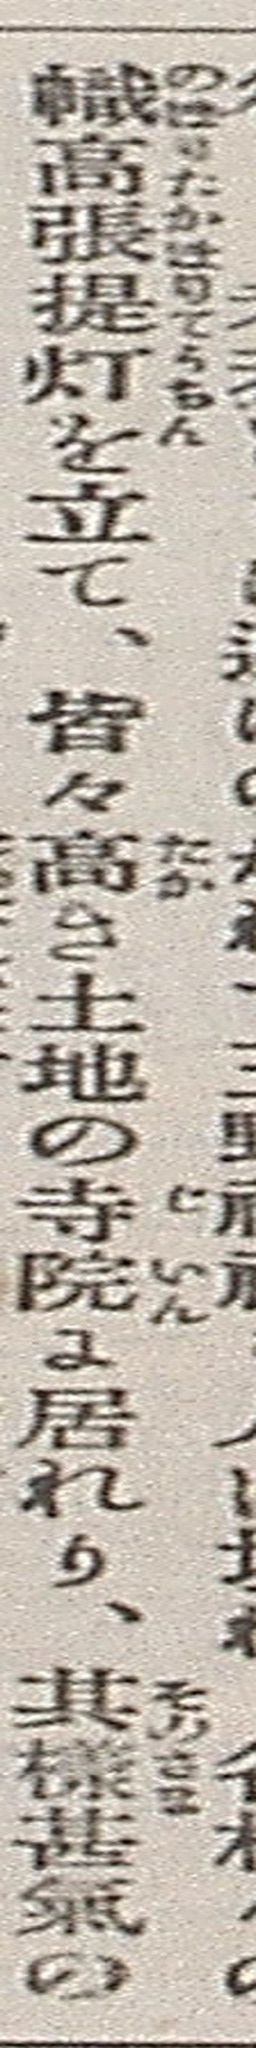幟高張提灯を立て、皆々高き土地の寺院に居れり、其様甚気の
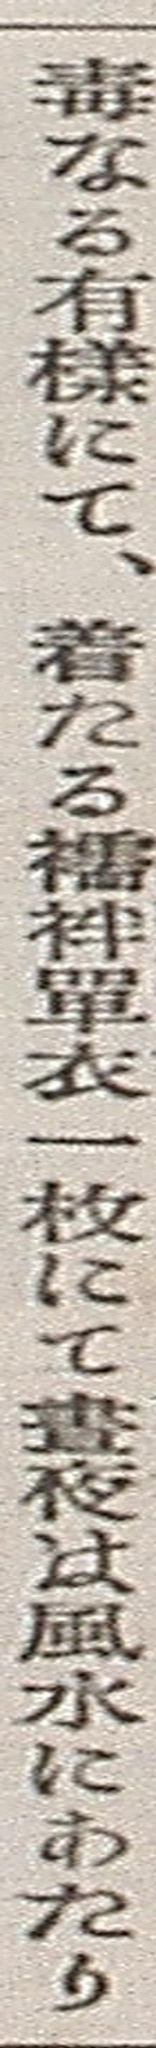毒なる有様にて、着たる襦袢単衣一枚にて晝夜は風水にあたり
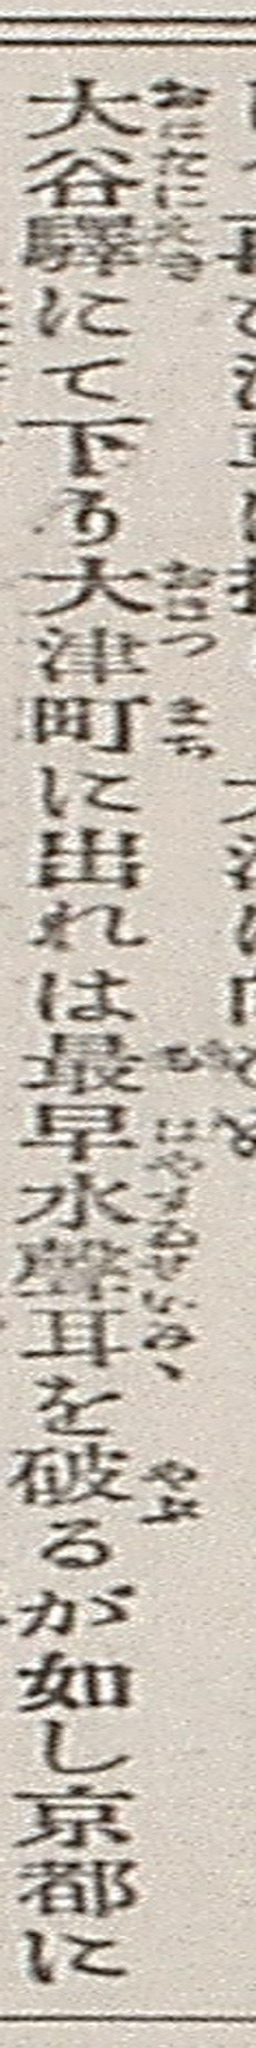大谷駅にて下り大津町に出れば最早水声耳を破るが如し京都に
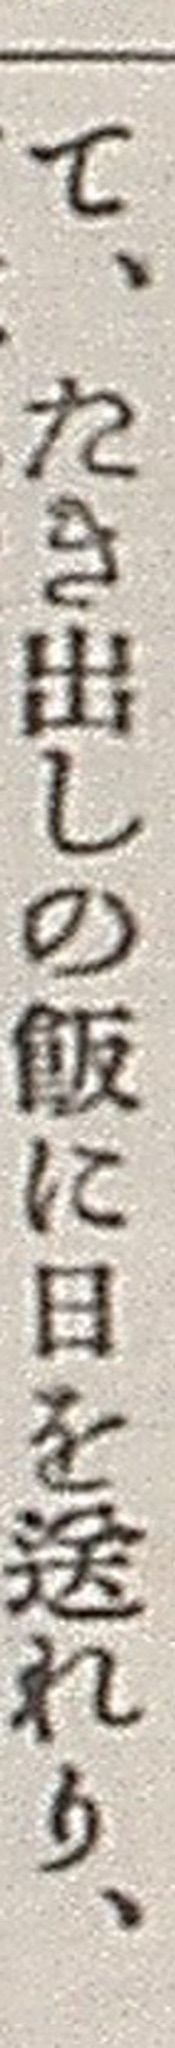て、たき出しの飯に日を送れり、
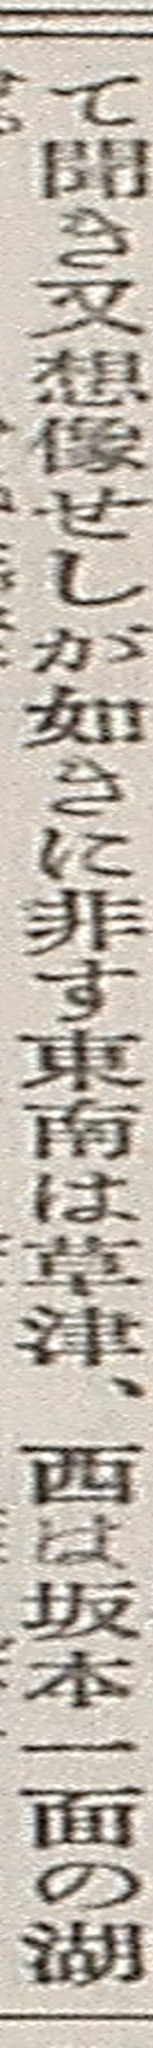て聞き又想像せしが如きに非す東南は草津、西は坂本一面の湖
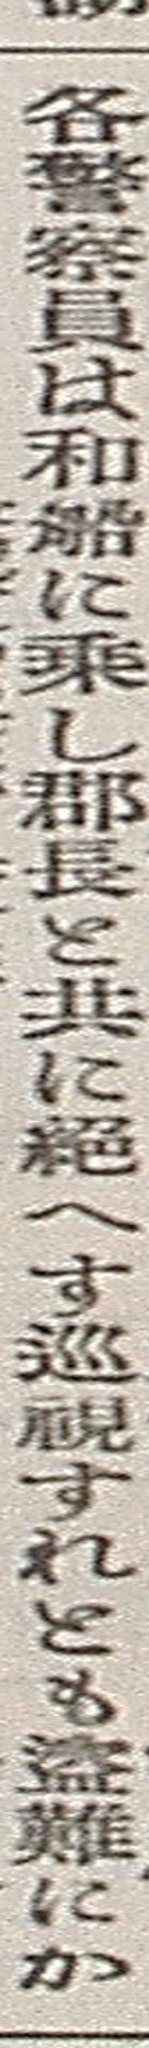各警察員は和船に乗し郡長と共に絶へす巡視すれとも盗難にか
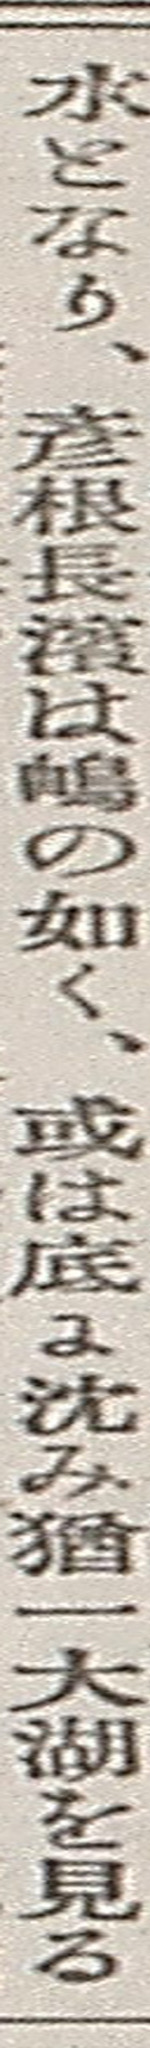水となり、彦根長浜は嶋の如く、或は底に沈み猶一大湖を見る
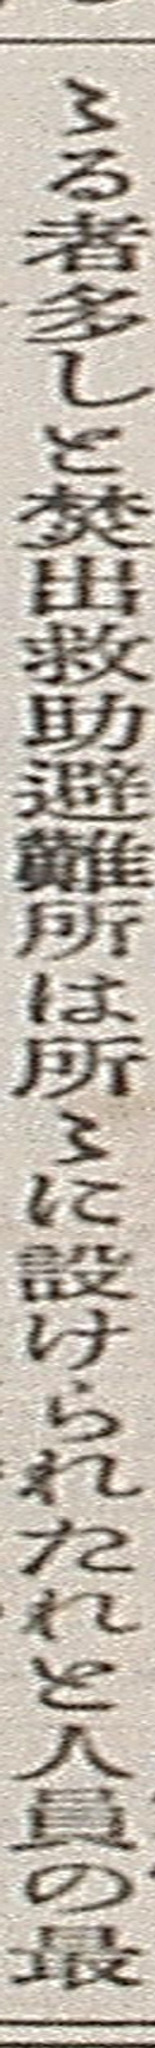ゝる者多しと焚出救助避難所は所々に設けられたれと人員の最
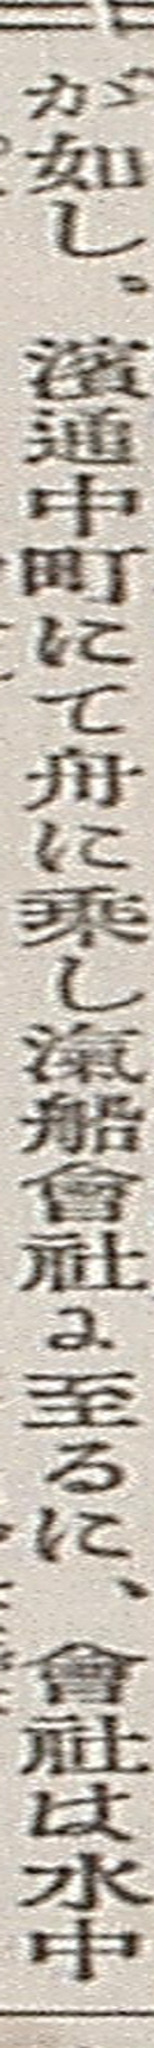が如し、浜通中町にて舟に乗し汽船会社に至るに、会社は水中
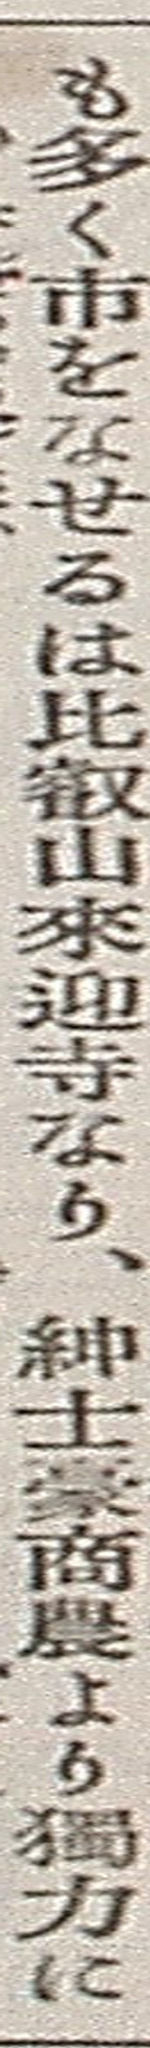も多く市をなせるは比叡山来迎寺なり、紳士豪商農より独力に
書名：風俗畫報臨時増刊第百二十八號　洪水被害録（下）
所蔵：東京大学地震研究所図書室 Earthquake Research Institute Library, The University of Tokyo, JAPAN
